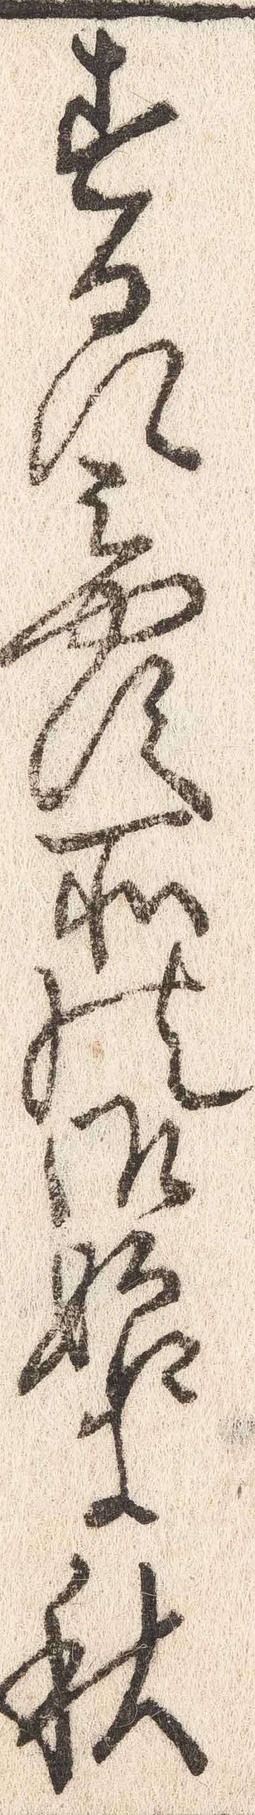するにみやす所の御娘に秋
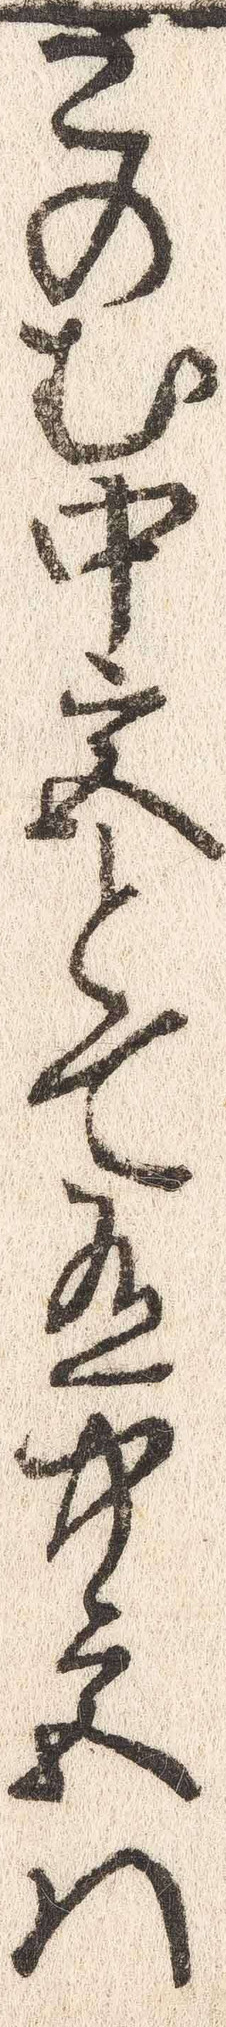このむ中宮とて有中宮は
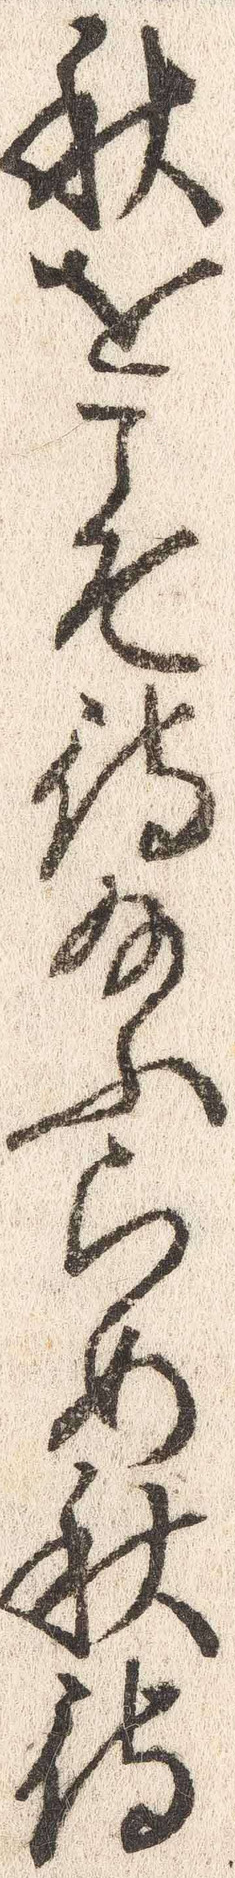秋をこそ待給ふらめ秋待
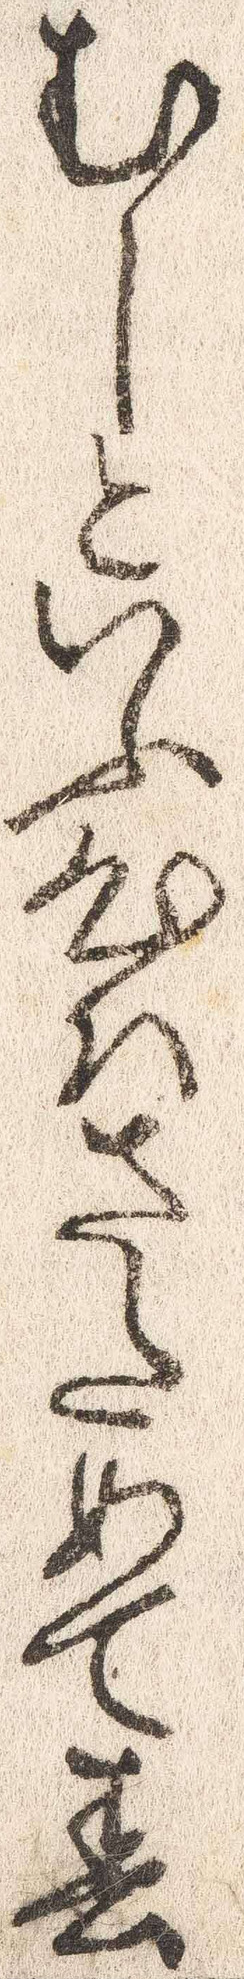むしといふ心はさためて春

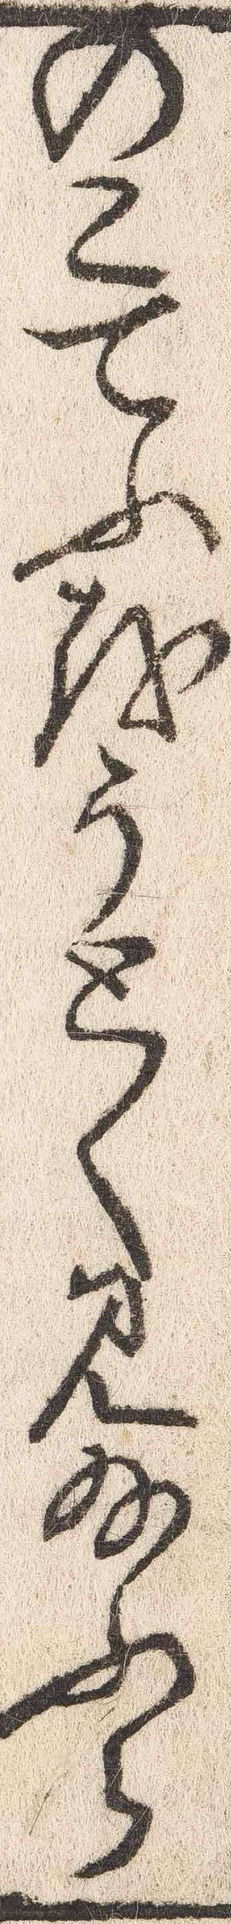のこてふをうとく見給ふら
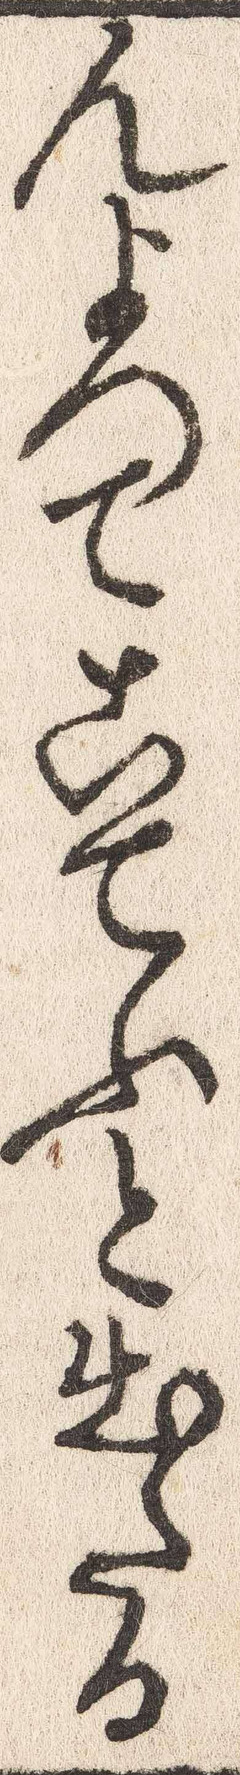んよつてこてふと出たる
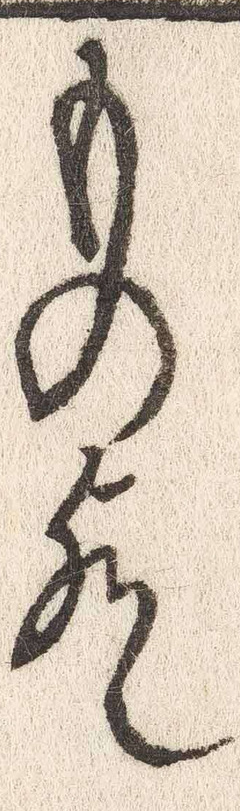もの歟
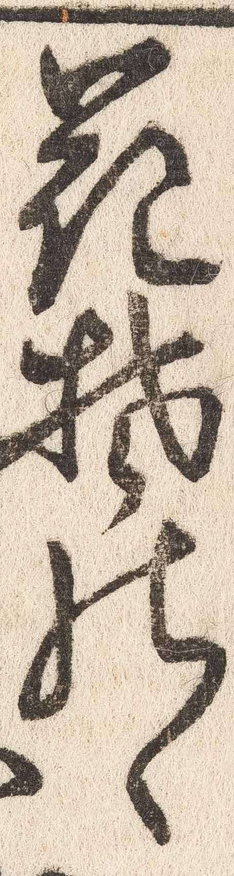花そのゝ
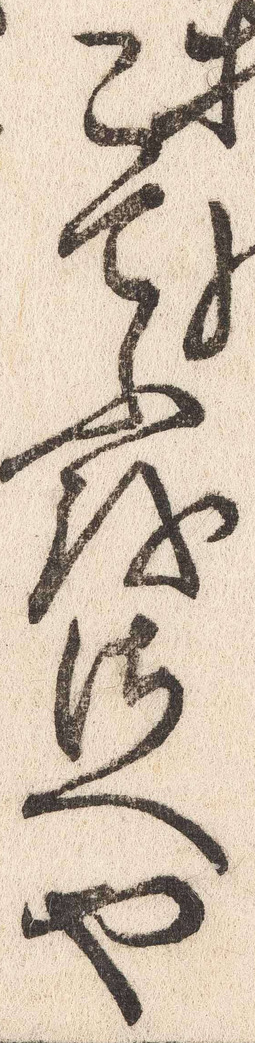こてふをさへや
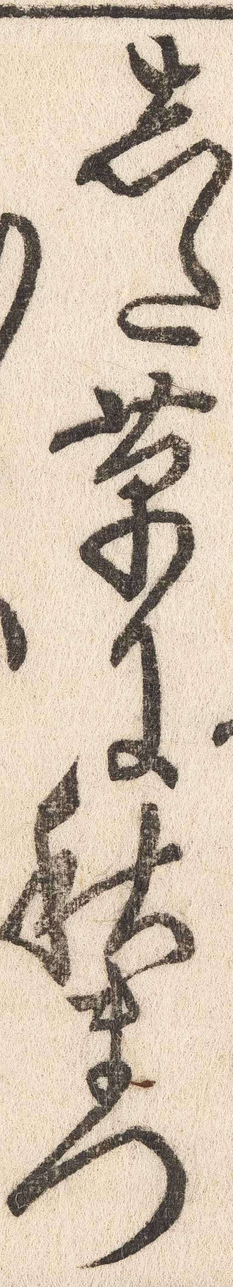した草に秋まつ
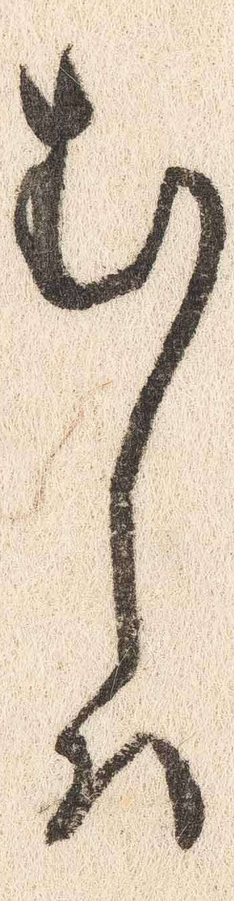むしは
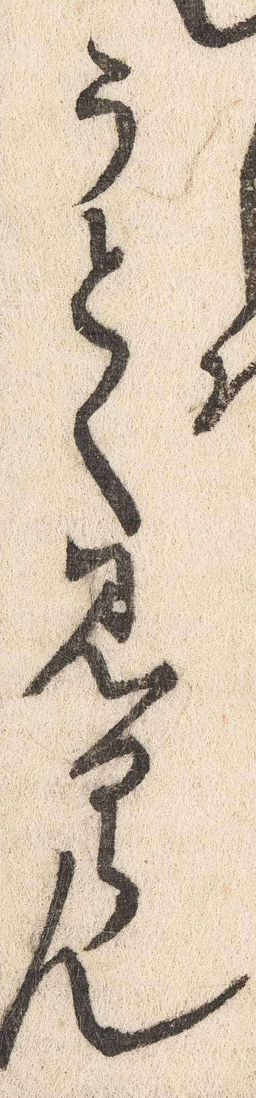うとく見るらん

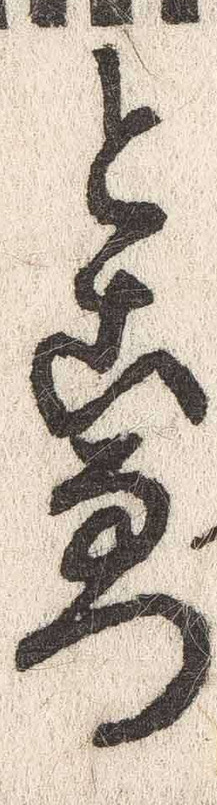とこなつ

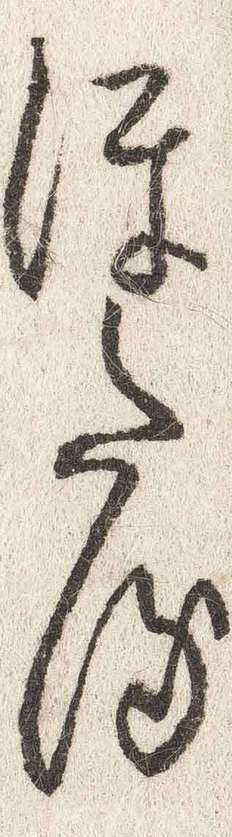ほたる
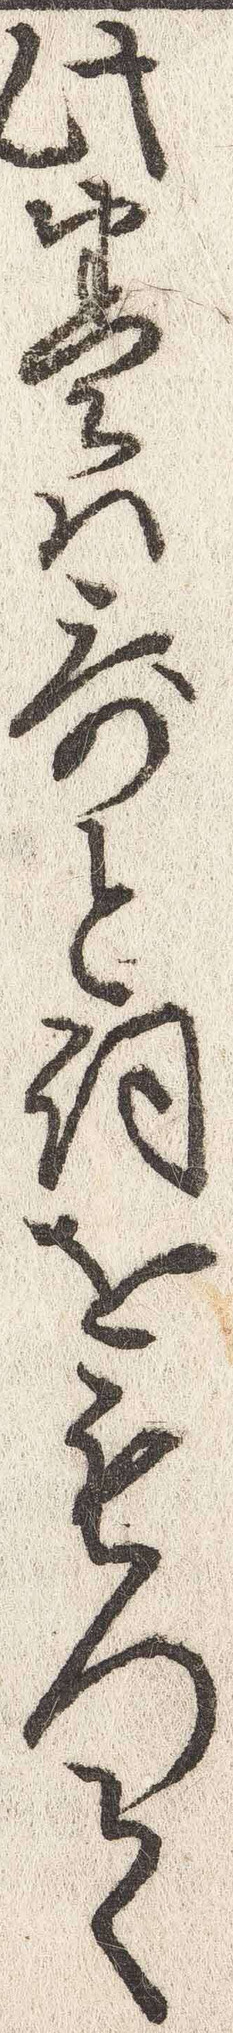此巻は歌と詞をもつて
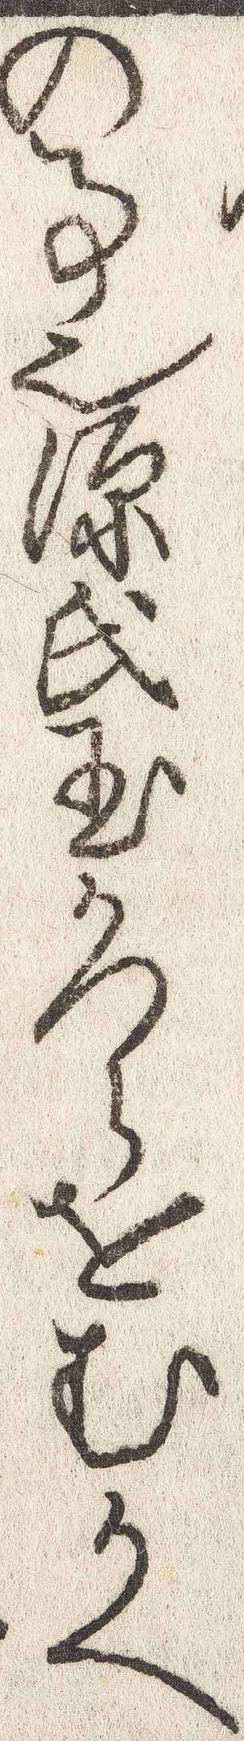の事也源氏玉かつらをむかへ
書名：源氏物語
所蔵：東京学芸大学附属図書館 国文学研究資料館
